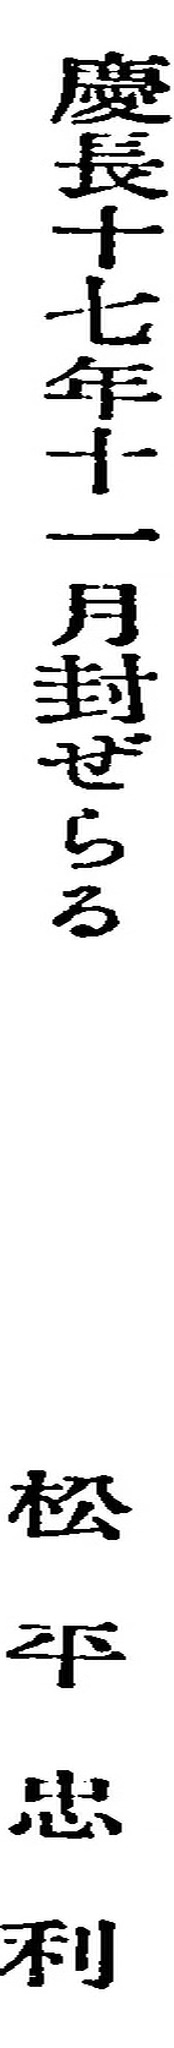慶長十七年十一月封ぜらる松平忠利
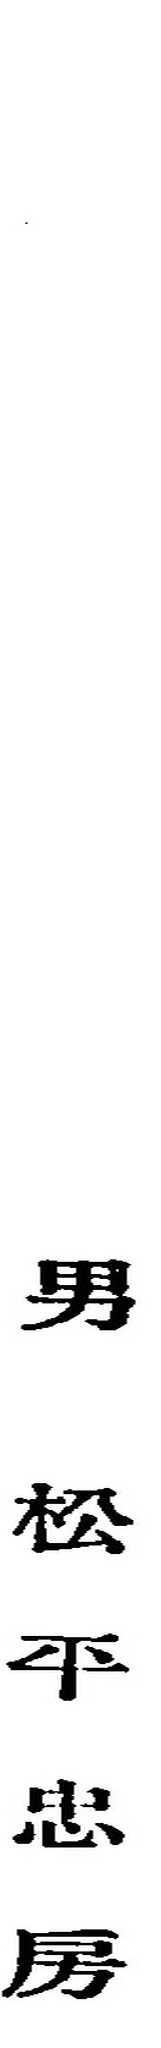男松平忠房
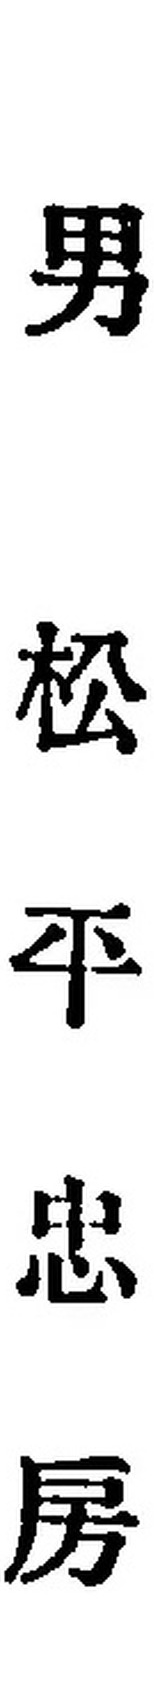男松平忠房
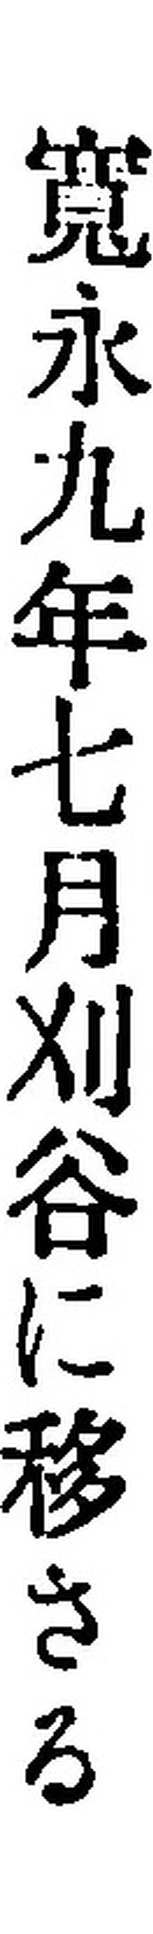寛永九年七月刈谷に移さる
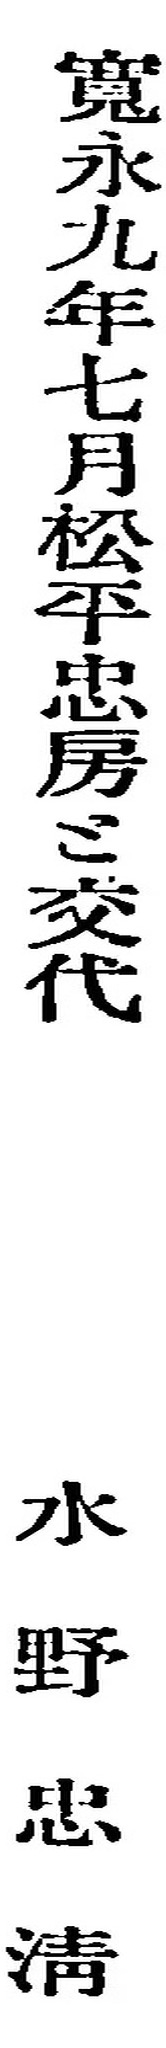寛永九年七月松平忠房と交代水野忠淸
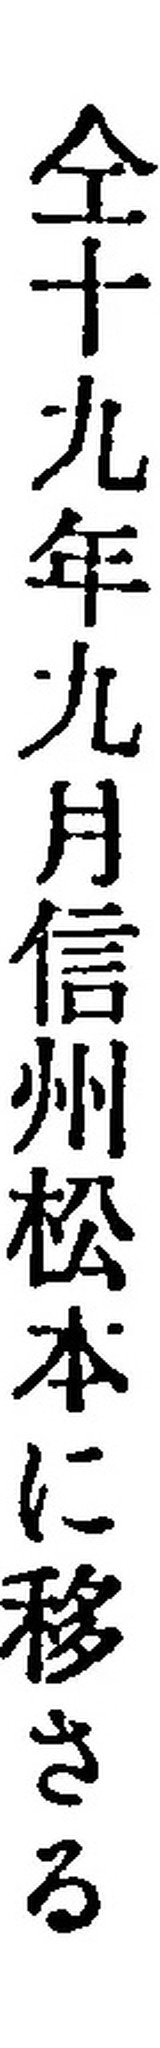仝十九年九月信州松本に移さる
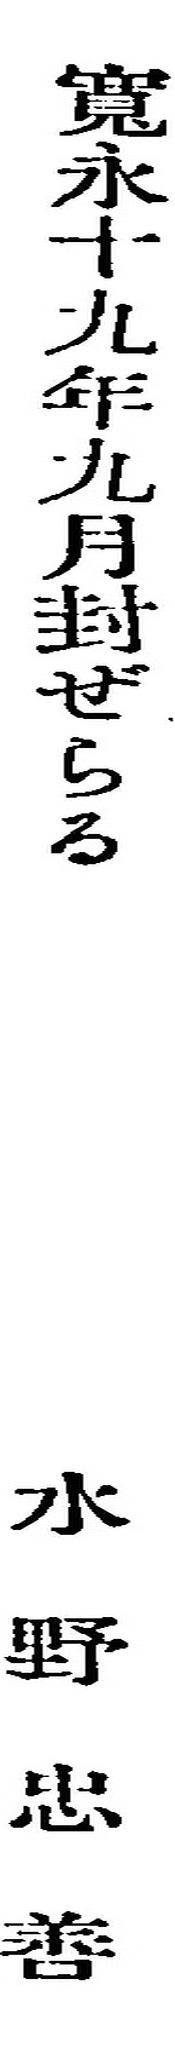寛永十九年九月封ぜらる水野忠善
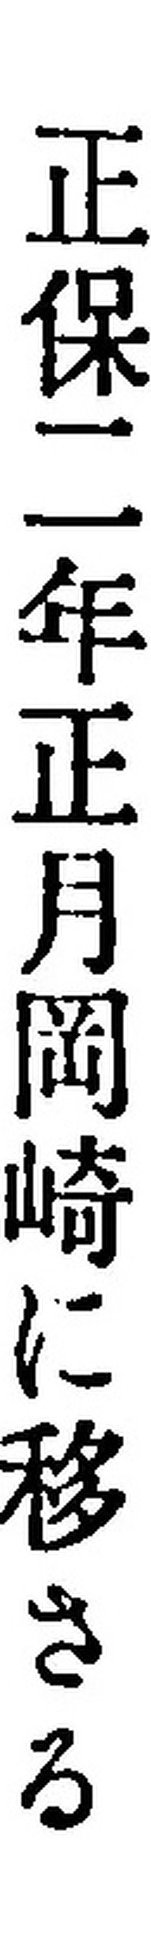正保二年正月岡崎に移さる
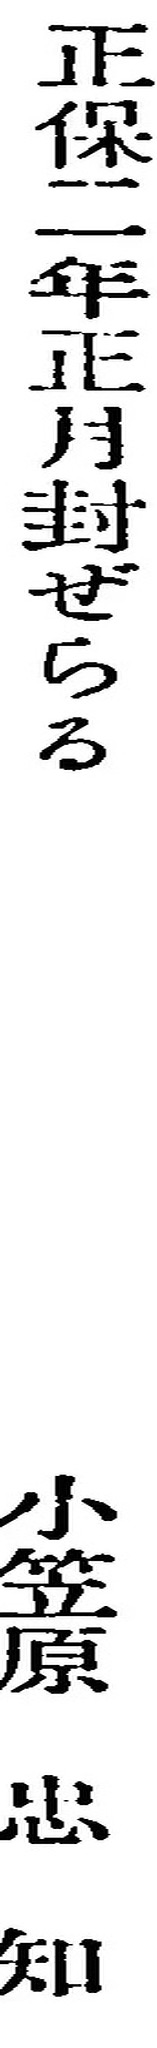正保二年正月封ぜらる小笠原忠知

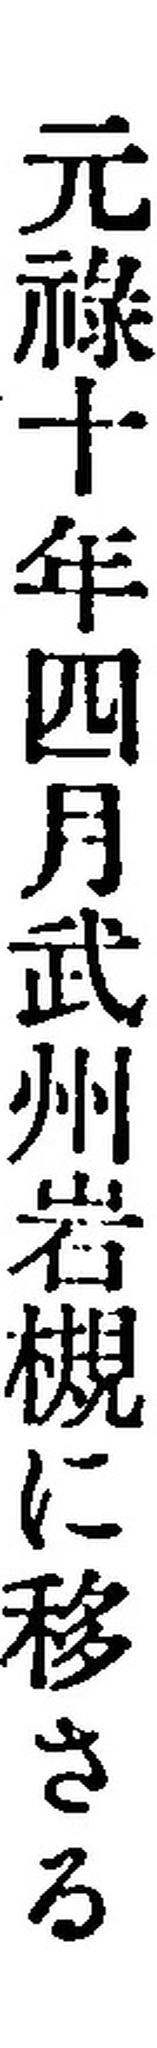元祿十年四月武州岩槻に移さる
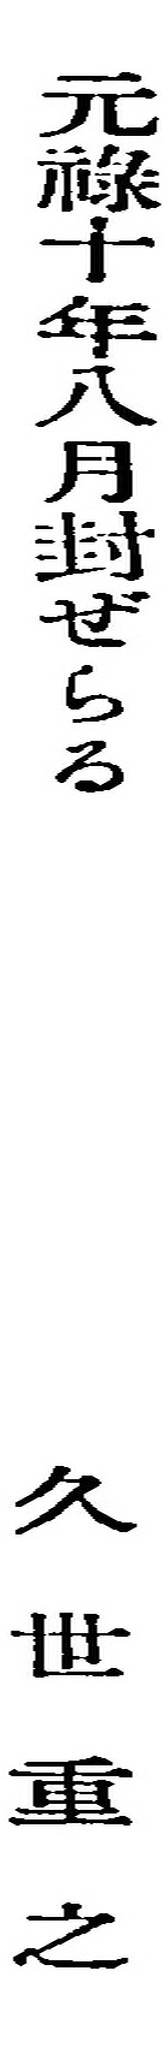元祿十年八月封ぜらる久世重之
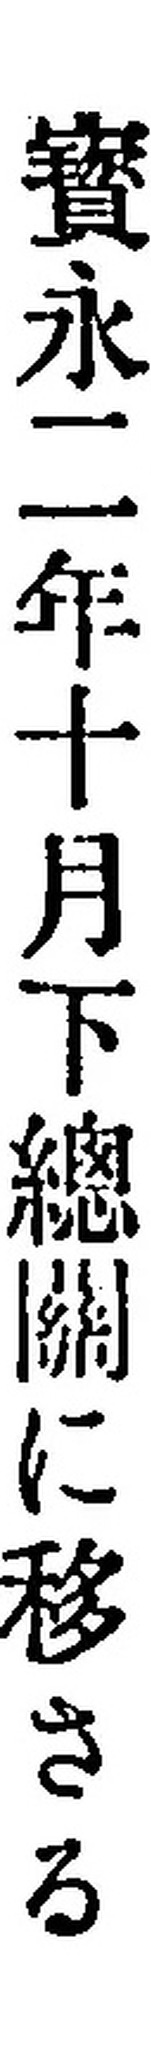寶永二年十月下總關に移さる
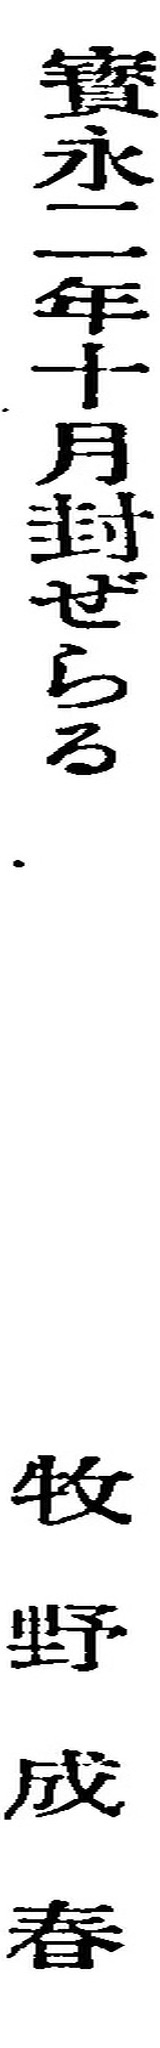寶永二年十月封ぜらる牧野成春
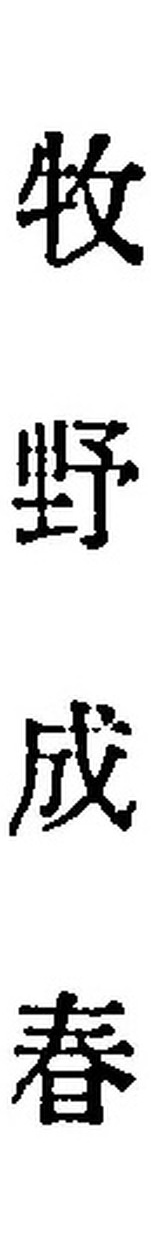牧野成央
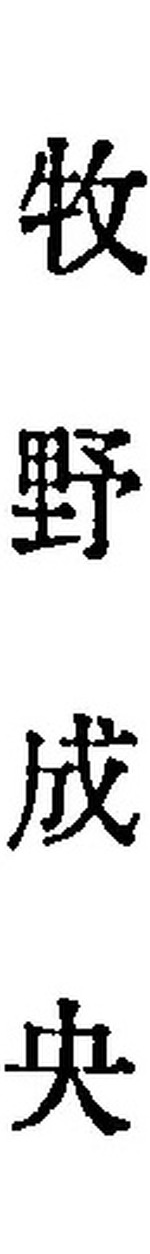牧野成央
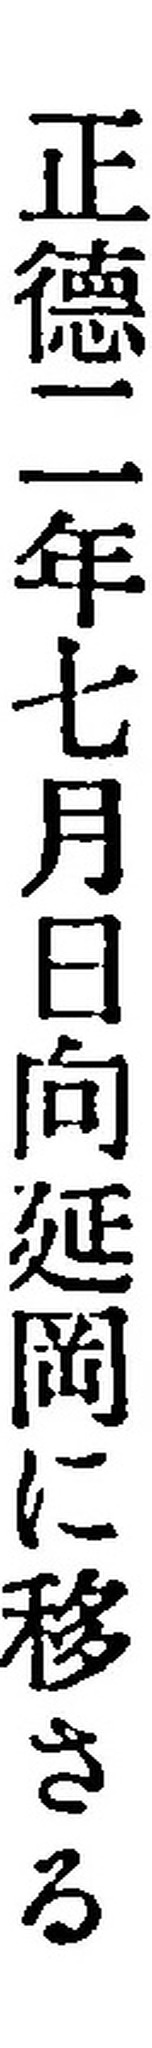正德二年七月日向延岡に移さる
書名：豊橋志要
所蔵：国立国会図書館 National Diet Library, JAPAN
